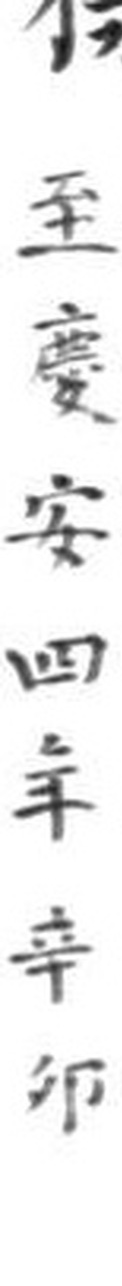至慶安四年辛卯

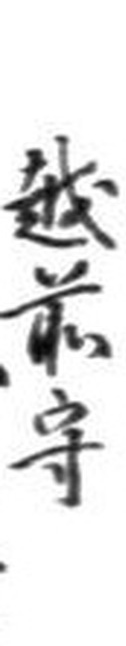越前守
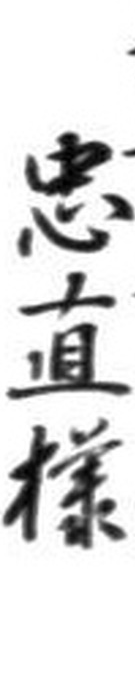忠直様
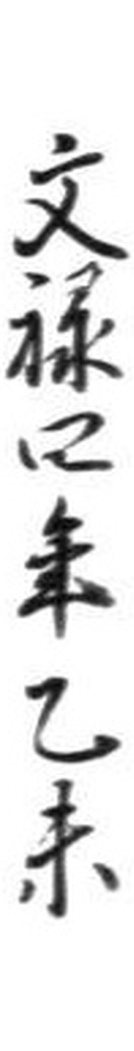文禄四年乙未
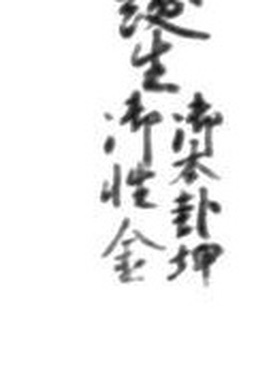御性金
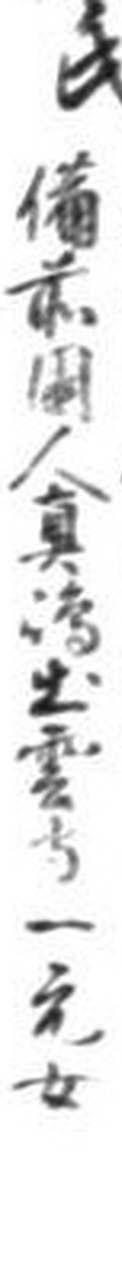備前国人真嶋出雲守一元女

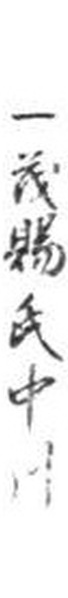一茂賜氏中川
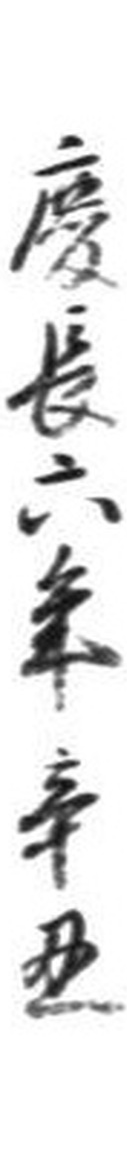慶長六年辛丑
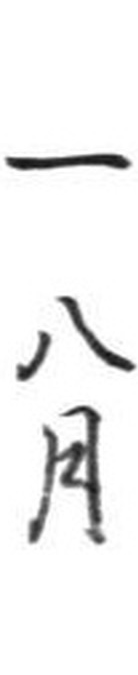一八月
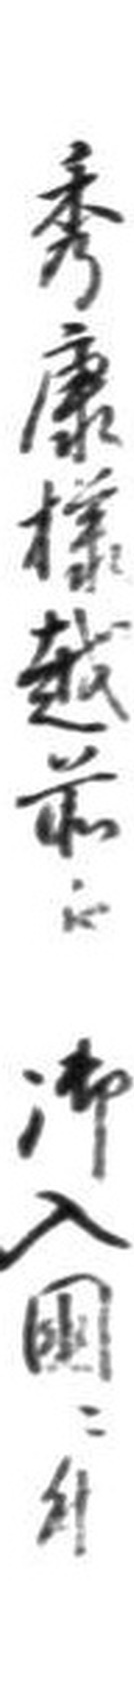秀康様越前江御入国ニ付
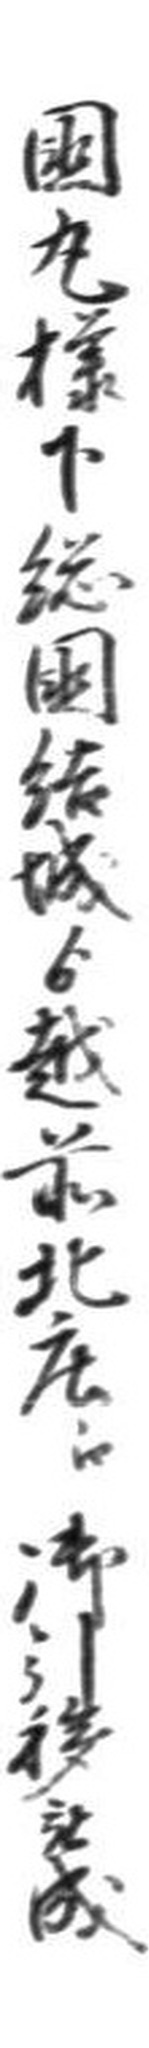国丸様下総国結城ゟ越前北庄江御引移被成

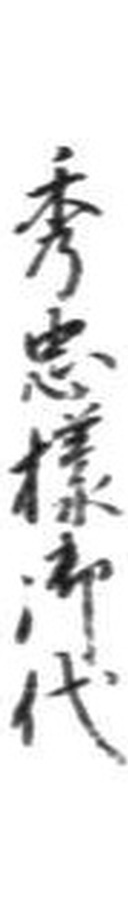秀忠様御代
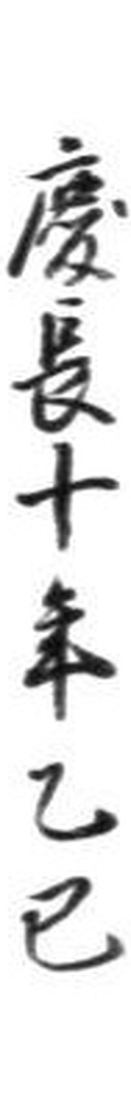慶長十年乙巳

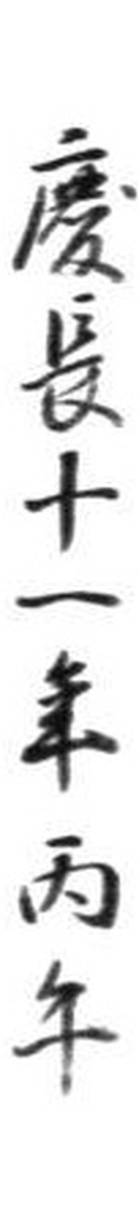慶長十一年丙午
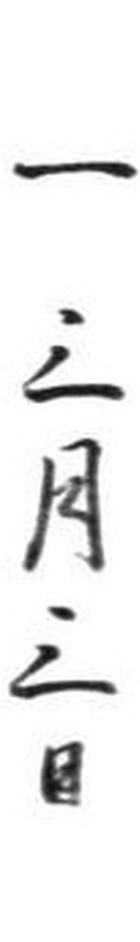一三月三日
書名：家譜 二 忠直公 従文禄四年到慶安四年
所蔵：福井県文書館 Fukui Prefectural Archives
